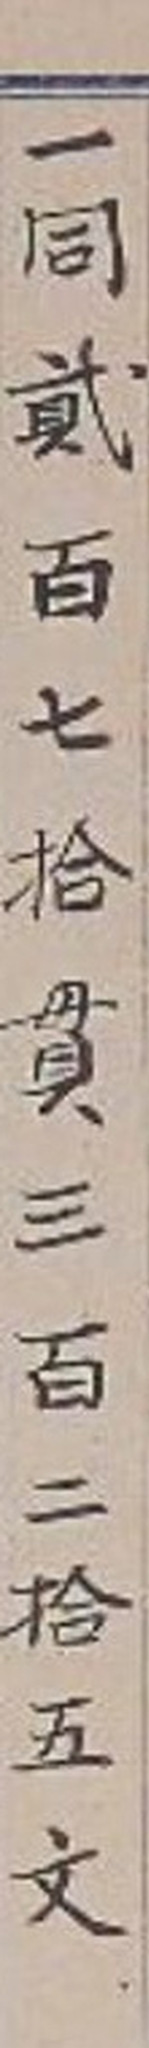一同貳百七拾貫三百弐拾五文
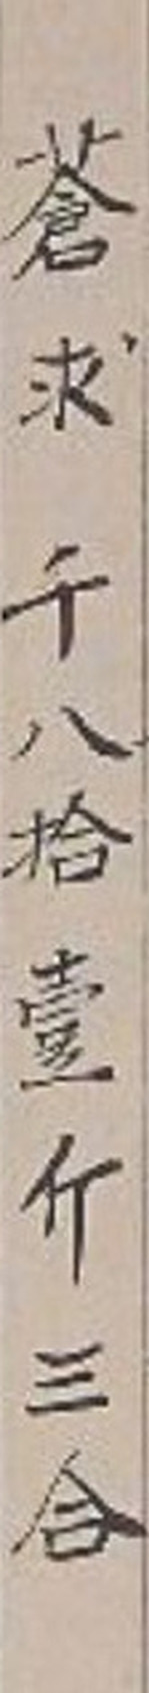蒼求千八拾壹斤三合
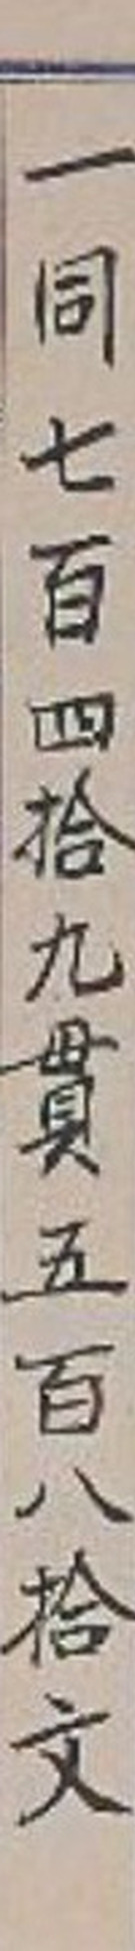一同七百四拾九貫五百八拾文
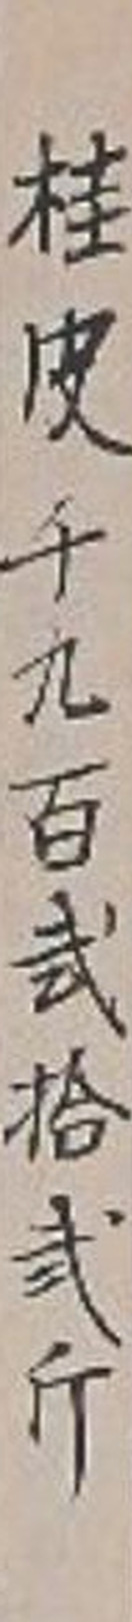桂皮千九百弐拾弐斤
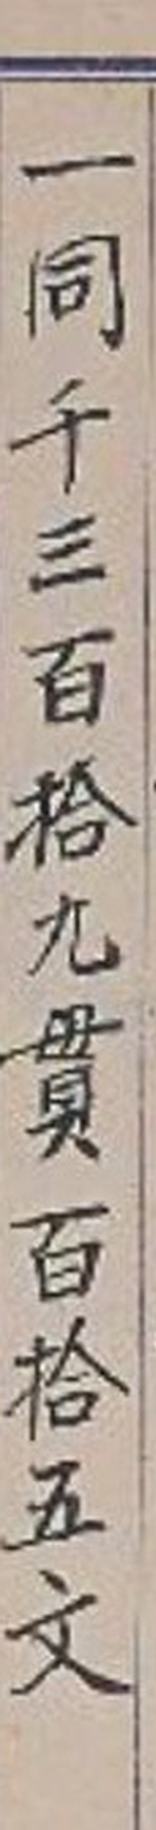一同千三百拾九貫百拾五文
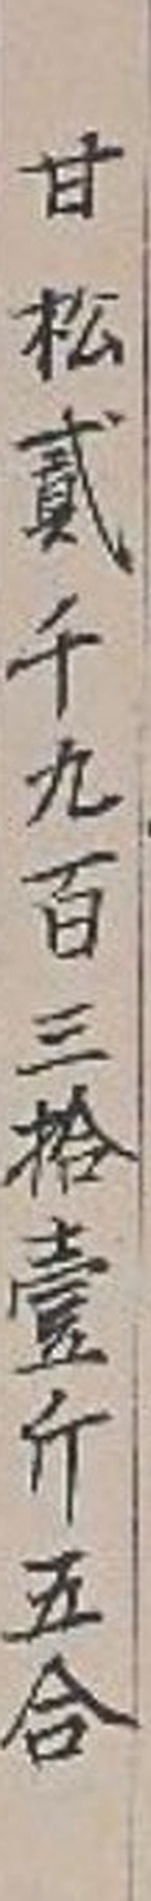甘松貳千九百三拾壹斤五合
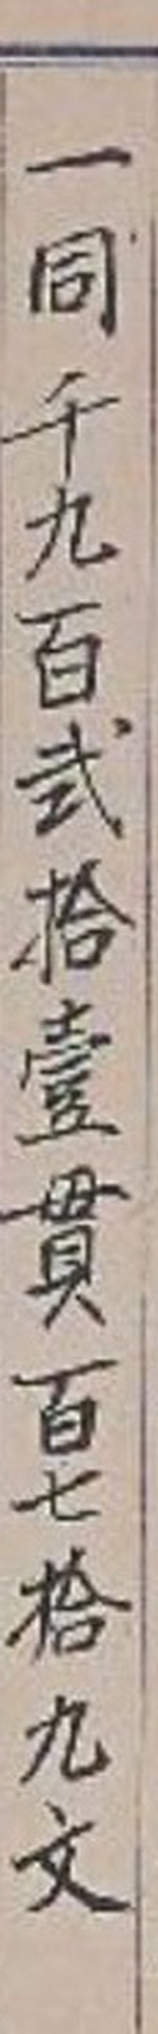一同千九百弐拾壹貫百七拾九文
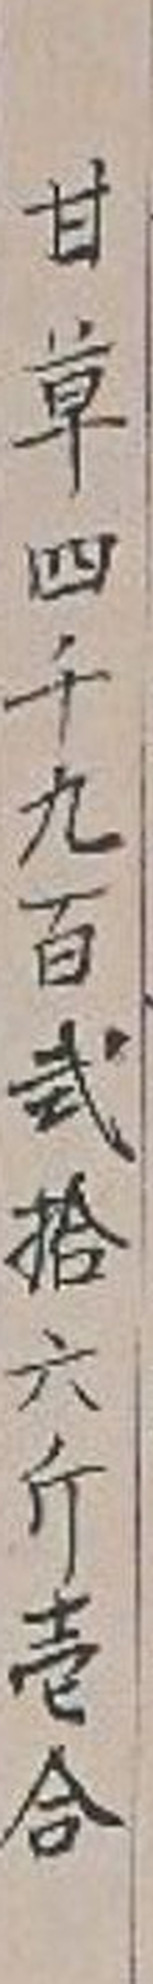甘草四千九百弐拾六斤壱合
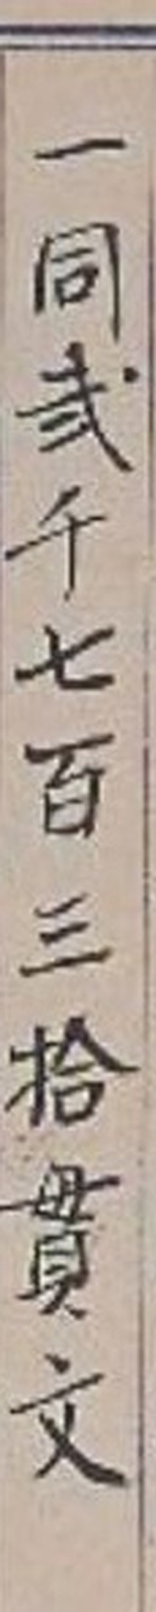一同弐千七百三拾貫文
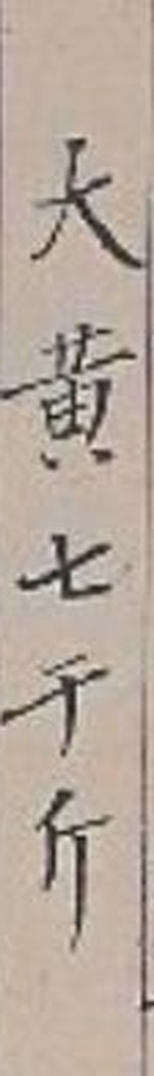大黄七千斤
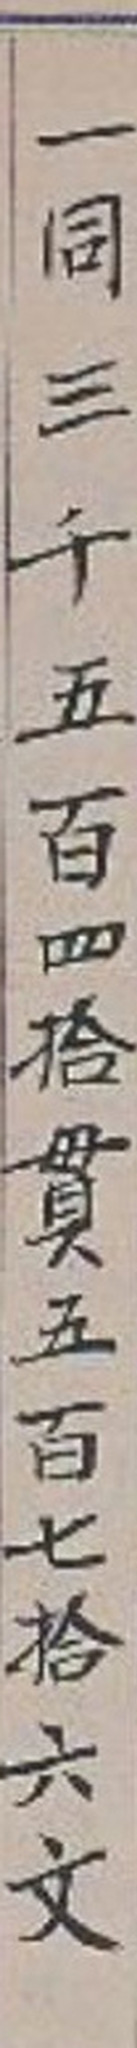一同三千五百四拾四貫五百七拾六文
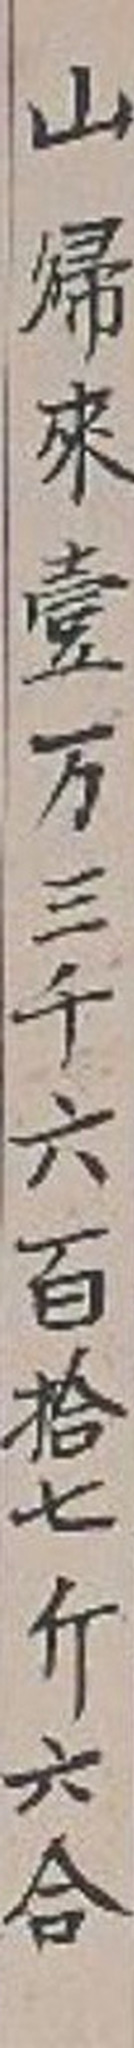山帰來壹万三千六百拾七斤六合

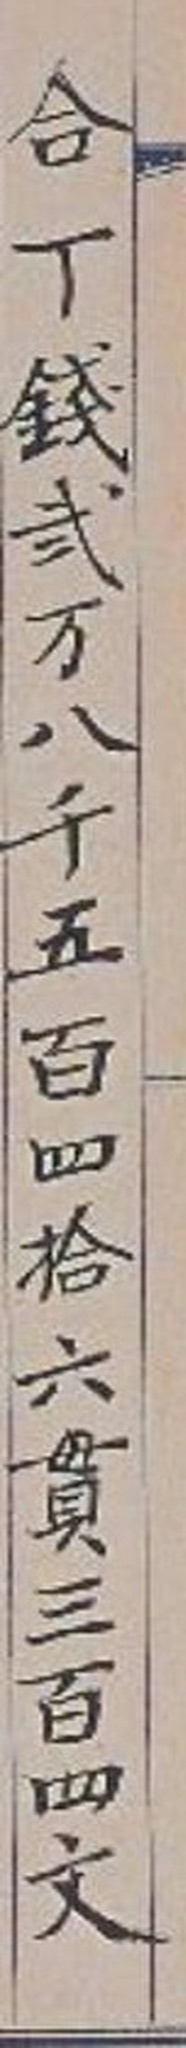合丁錢弐万八千五百四拾六貫三百四文
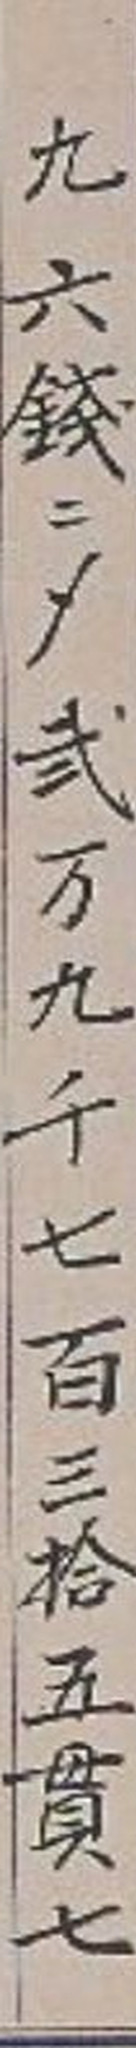九六銭ニシテ弐万九千七百三拾五貫七
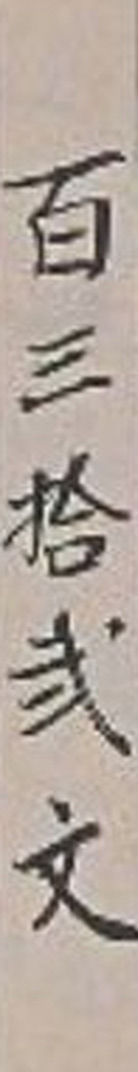百三拾弐文
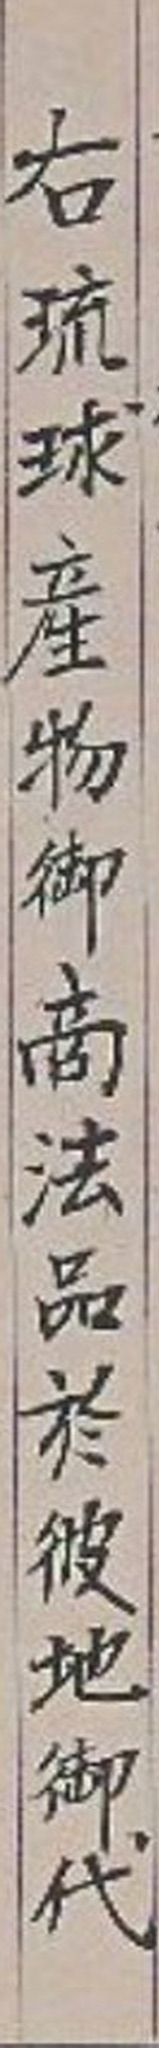右琉球産物御商法品於彼地御代
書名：琉球産物於長崎拂立並本手品利潤総帖 弘化四年より酉年迄
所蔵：University of the Ryukyus Library
